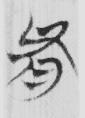{父肉}
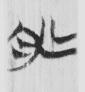{月亡}
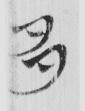多
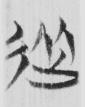從
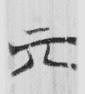亓
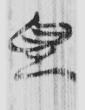見
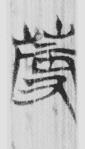蓐
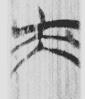夫
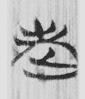老
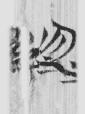溺
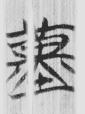堇
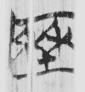{厤土}
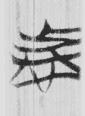者
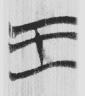王
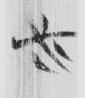必
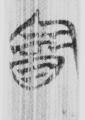酓
